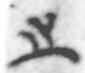之
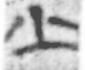少
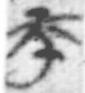帀（師）
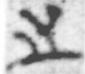之
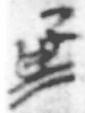爲
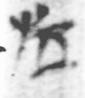○（左）
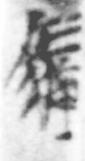○（服）
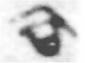司
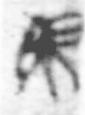馬
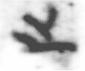之
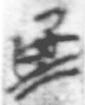爲
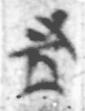○（右）
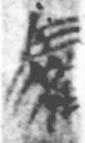○（服）
